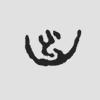凼
